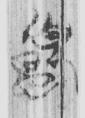{日虫頁}
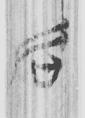后
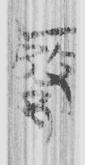{殷邑}
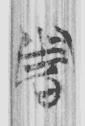周
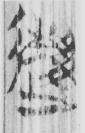{辶埶}
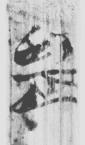監
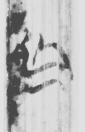於
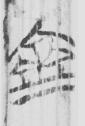齊
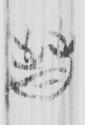晉
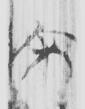宋
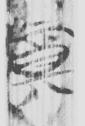奠
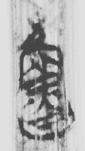魯
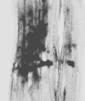之
